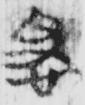快
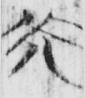癸
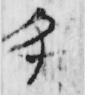丑
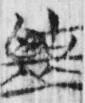○（盬）
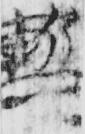漸
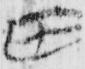甲
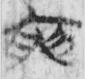寅
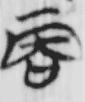丙
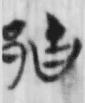邮
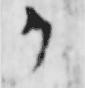人
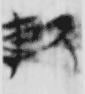○（範）
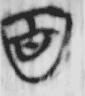固
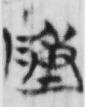○（陳）
